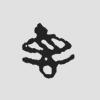德
